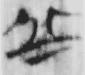丘
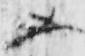之
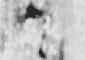人
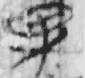果
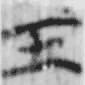王
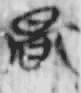晨
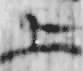上
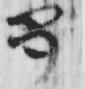邑
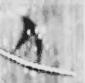人
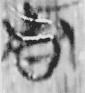周
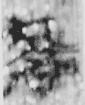喬
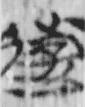遊
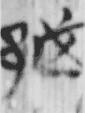○（越）
